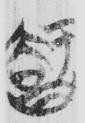智
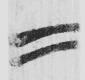二
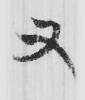又
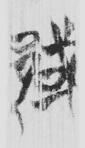{或阝}
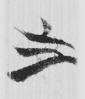之
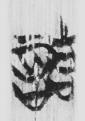請
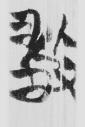敢
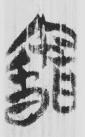{尒䎽}
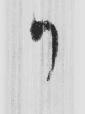人
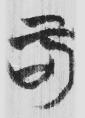可
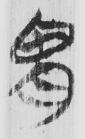胃
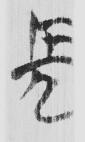長
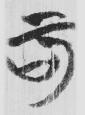可
